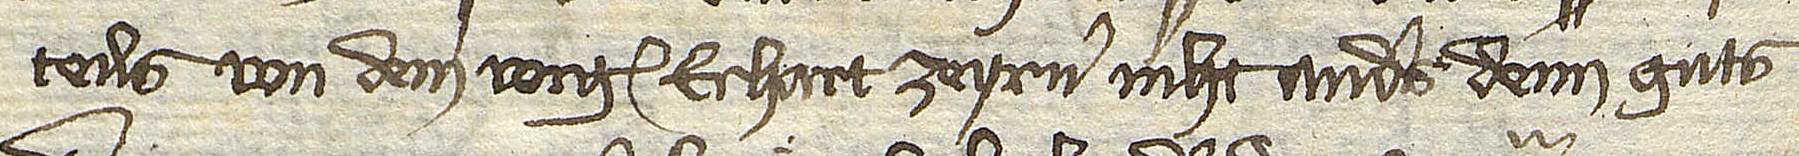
teils von dem vorg* Erhart ʒeyrn* niht and*s denn guts
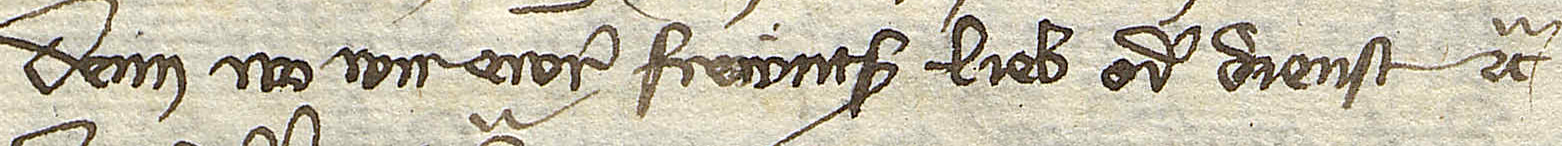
Denn wo wir ewr* freẅntſ* lieb od* dienſt ec*
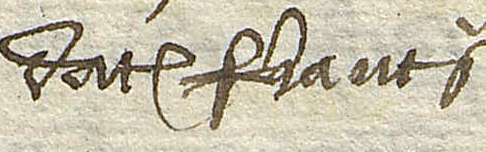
Dat* fi*a ut ſ*
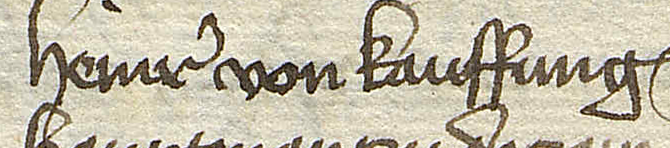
heinr* von kauffung*
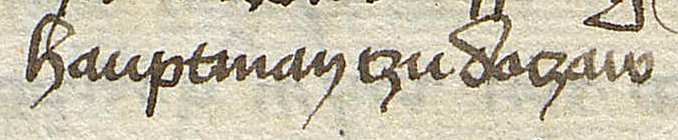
hauptman cʒu docʒaw
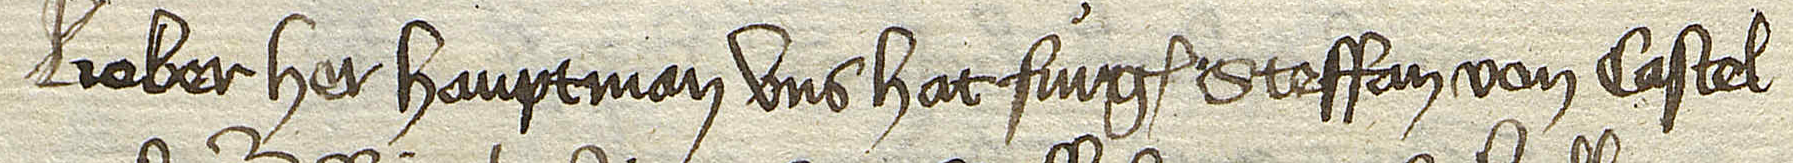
Lieber her hauptman vns hat fürg* Steffan von Caſtel
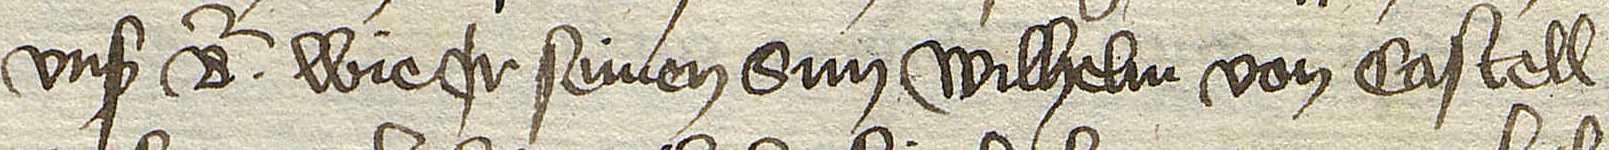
vnſ* B* . wie Ir ſeinen Sun wilhelm von Caſtell
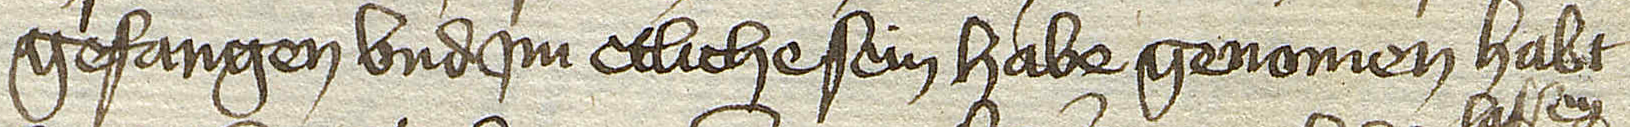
gefangen vnd Im etliche ſein habe genomen habt
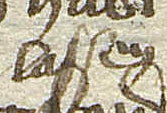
laſſen
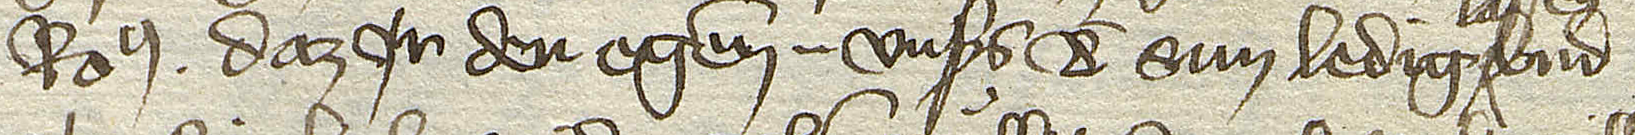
Ro* . daʒ Ir den egen* ~ vnſ*s B* Sun ledig vnd
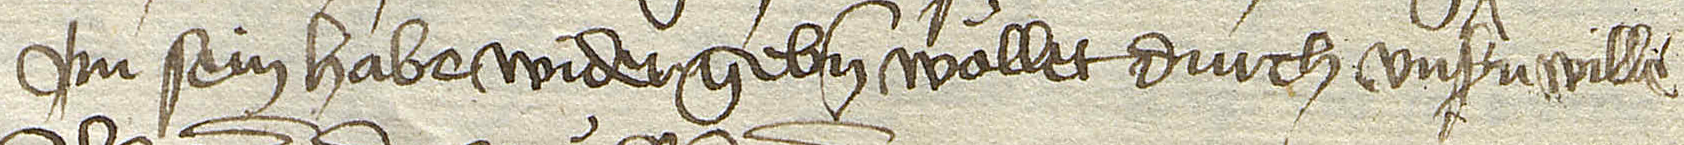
Im ſein habe wider gebn* wöllet durch vnſ*n wille*
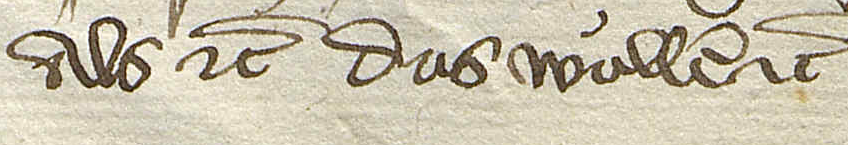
Als ec* Das wölle* ec*
